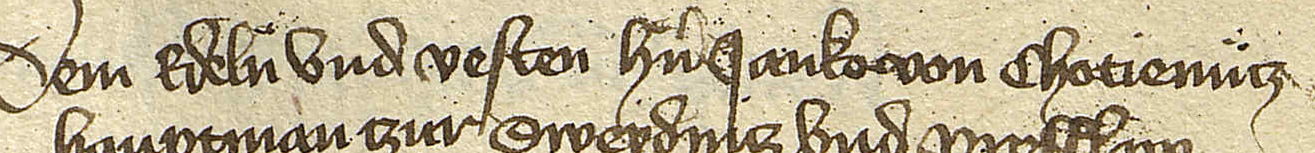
Dem Edeln vnd veſten hn* Ianko von Chotienücʒ
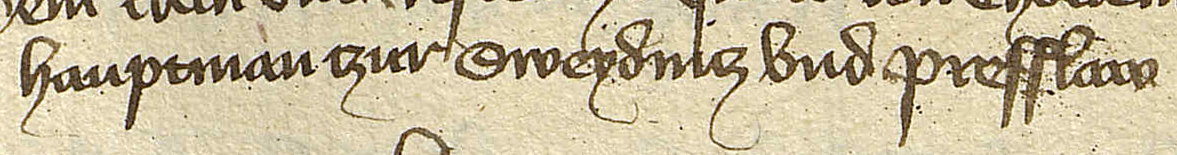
hauptman cʒur Sweydnicʒ vnd Preſſlaw
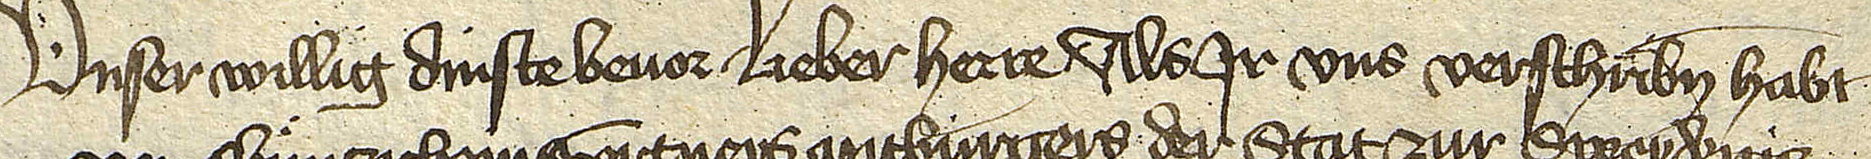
Vnſer willig dinſte beuor / Lieber herre / Als Ir vns verſchribn* habt
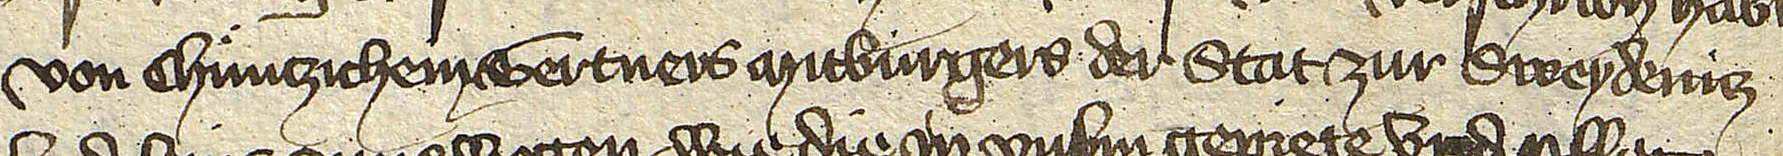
von Chüncʒichein Gertners Mitburgers der Stat cʒur Sweydenicʒ
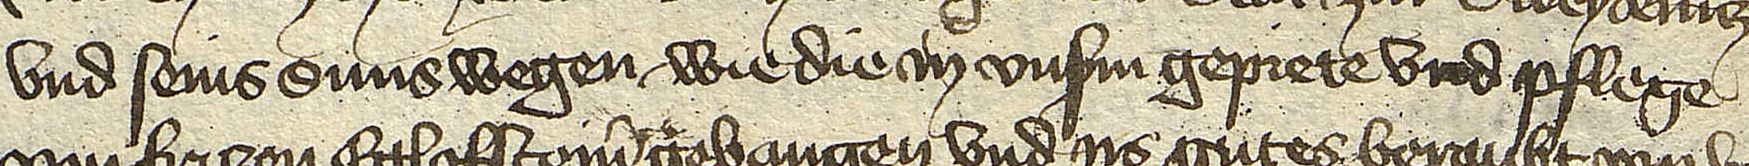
vnd ſeins Suns wegen / wie die In vnſ*m gepiete vnd pflege
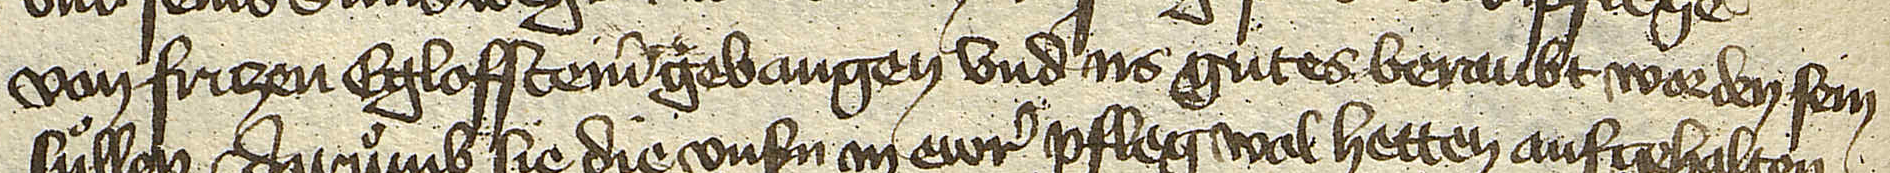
von fricʒen Eglofſtein* gevangen vnd irs gutes beraubt worden ſein
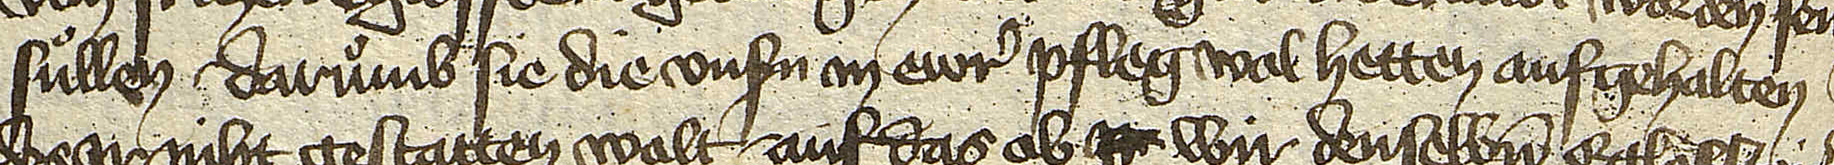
ſüllen / darümb ſie die vnſ*n in ewr* pfleg wol hetten aufgehalten
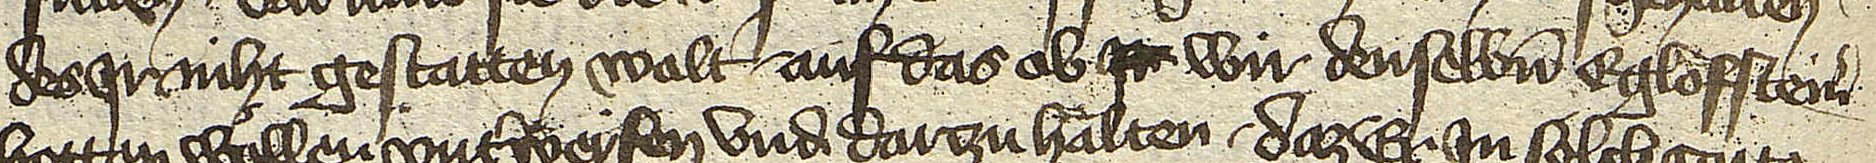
des Ir niht geſtatten wolt / auf das ob Ir wir denſelbn* Eglöfſtein*
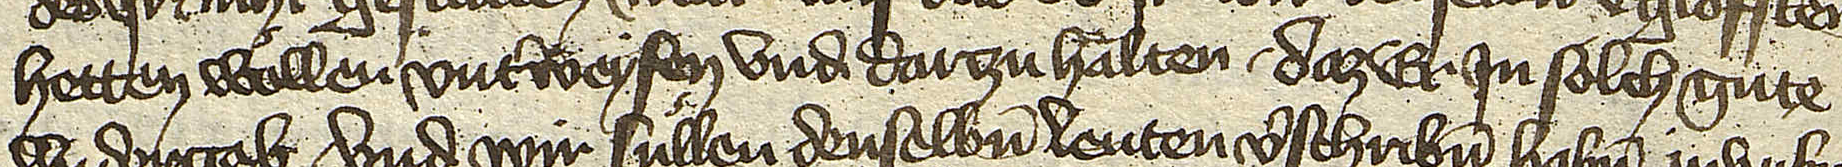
hetten wöllen vnt*weyſen vnd darcʒu halten / daʒ Er In ſolich gute
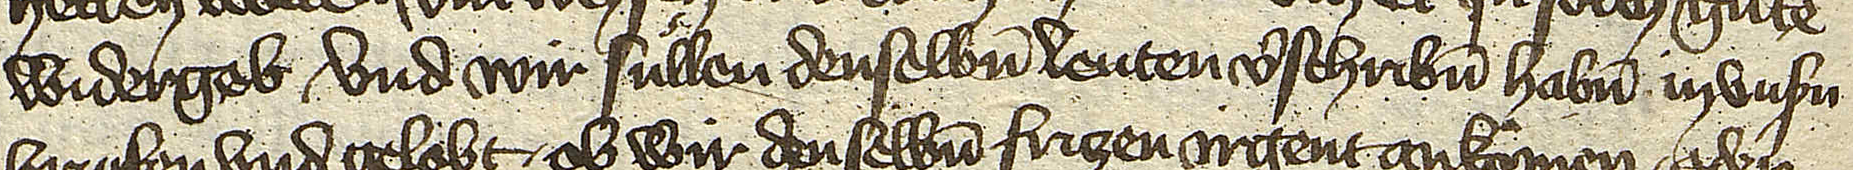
widergeb / vnd wir ſüllen denſelbn* leuten v*ſchribn* habn* in vnſ*n
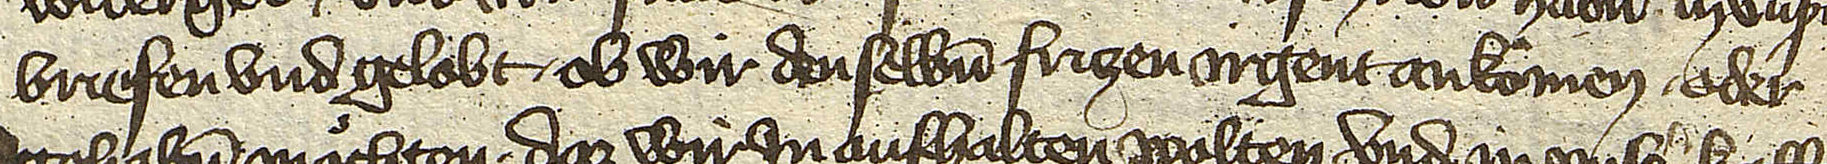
briefen vnd gelobt / ob wir denſelbn* fricʒen irgent ankömen / oder
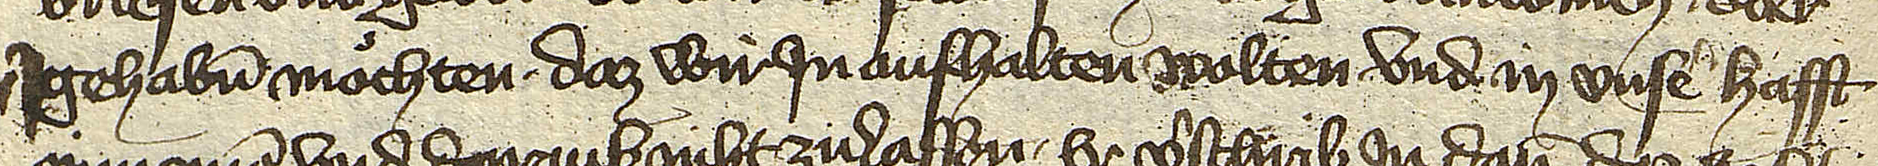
gehabn* möchten / daʒ wir In aufhalten wolten / vnd in vnſe* hafft
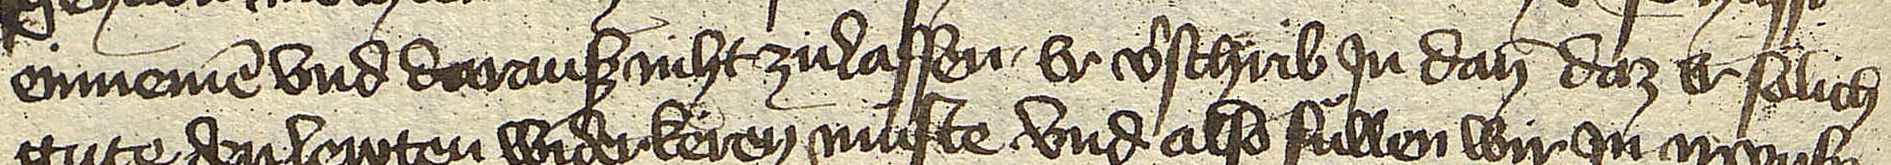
einneme* vnd darauſʒ niht cʒulaſſen / Er v*ſchrib In dan* daʒ Er ſolich
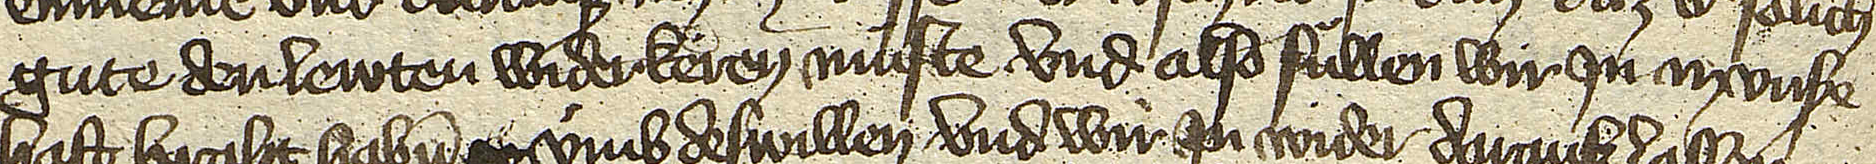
gute den lewten widerkeren müſte / vnd alſo ſüllen wir In in vnſ*e
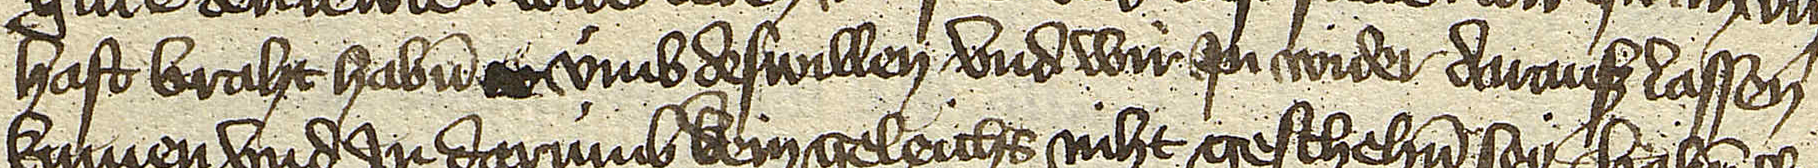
haft braht habn* % v̈mb deſwillen vnd wir In wider darauſʒ laſſen
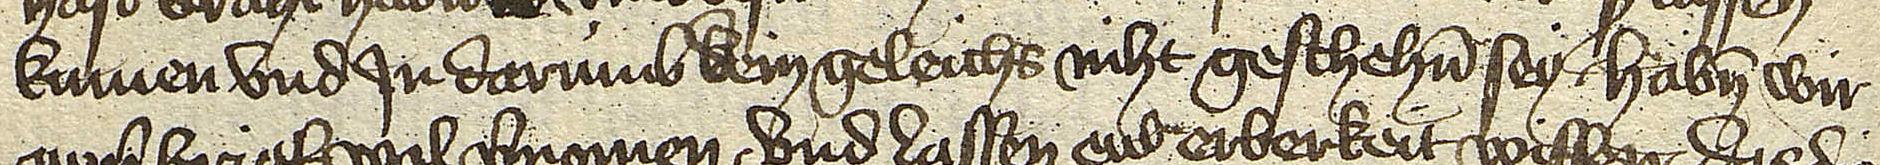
kumen vnd In darümb kein geleichs niht geſchehn* ſey / habn* wir
